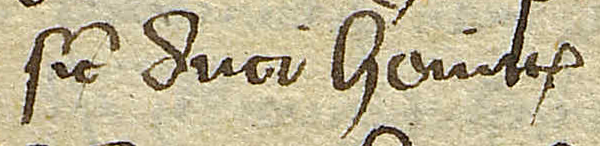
ſic* duci heinri*
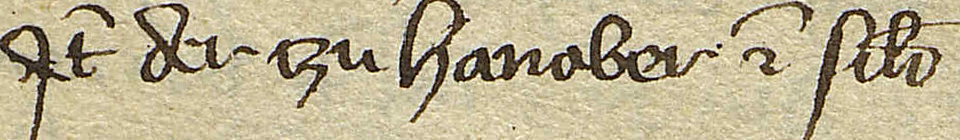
It* der cʒu hanober % ſilr*
